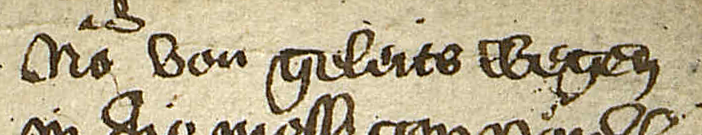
No* von geleits wegen
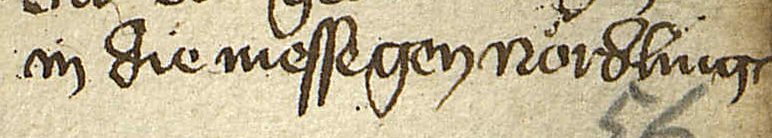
in die meſſe gen Nördling*
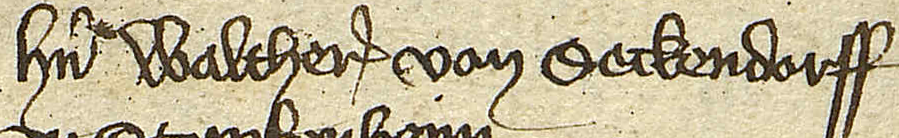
hn* Walther* von Seckendorff
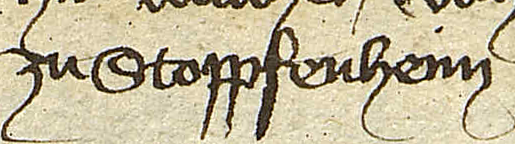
cʒu Stoppfenheim
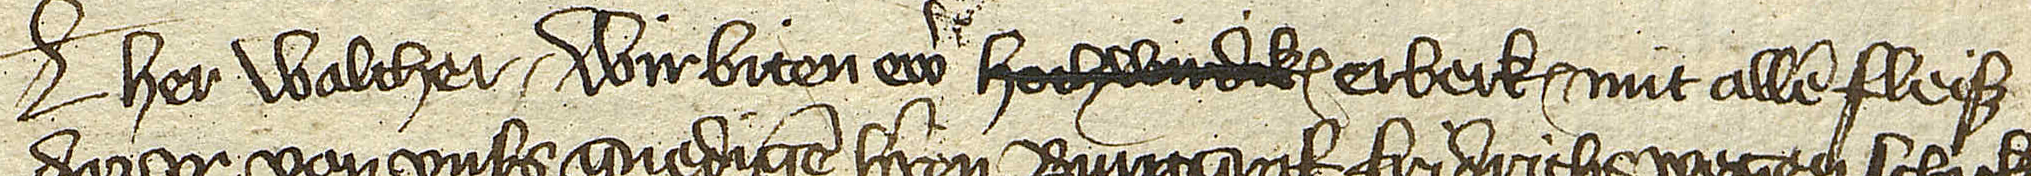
L* her Walther / Wir biten ew* hochwirdik* erberk* mit alle* fleiſʒ
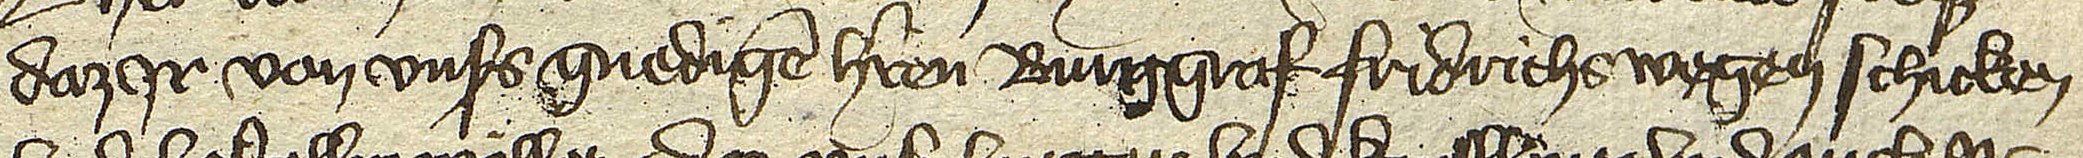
daʒ Ir von vnſ*s gnedige* h*ren Burggraf fridrichs wegen ſchicken
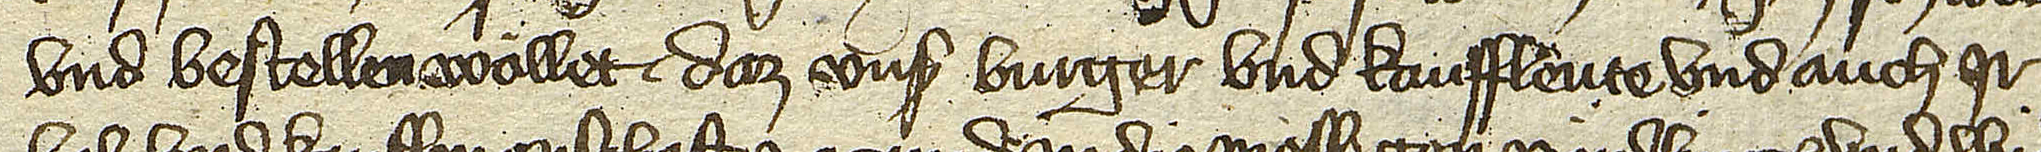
vnd beſtellen wöllet / daʒ vnſ* burger kauffleute vnd auch Ir
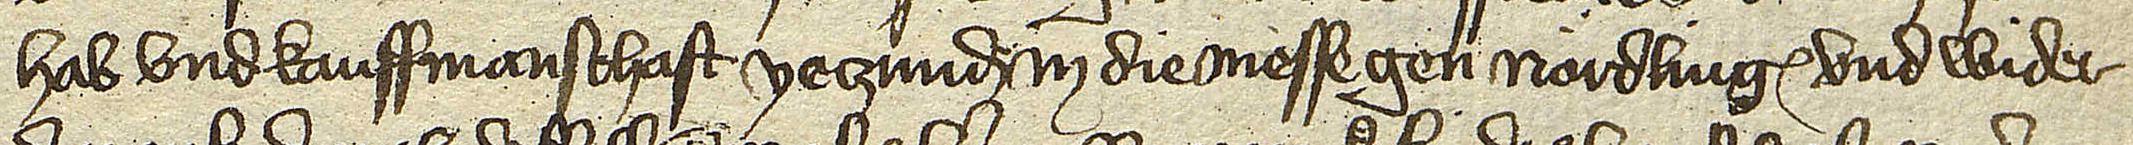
hab vnd kauffmanſchaft yecʒund* in die meſſe gen Nördling* vnd wider
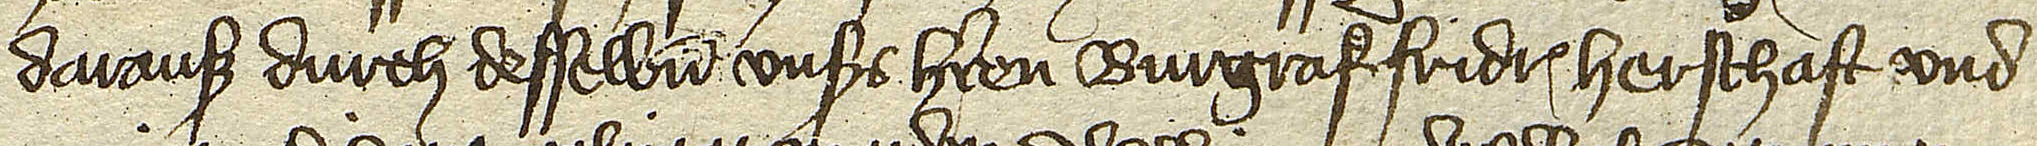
darauſʒ durch deſſelbn* vnſ*s hr*en Burgraf fridr* herſchaft vnd
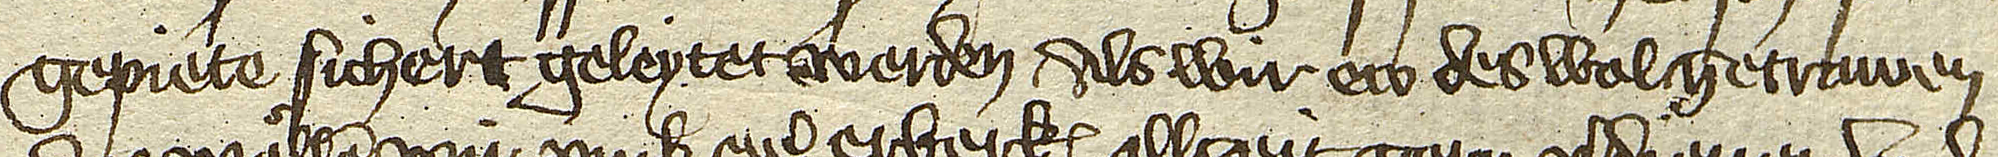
gepiete ſichert geleytet werden / Als wir ew des wol getrawen
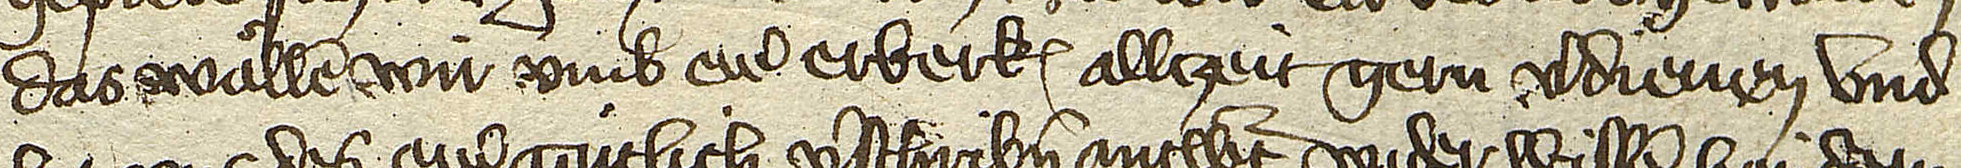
das wölle* wir vmb ew* erberk* allcʒeit gern v*dienen vnd
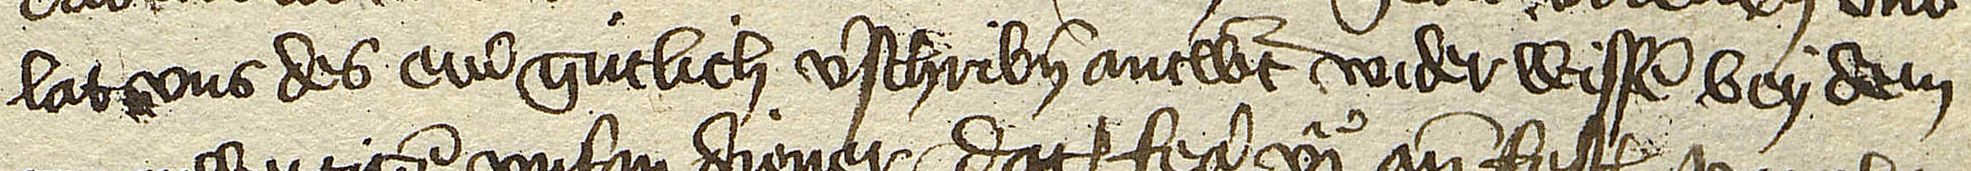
lat vns des ew* gütlich v*ſchribn* antwt* wider wiſſe* bey dem
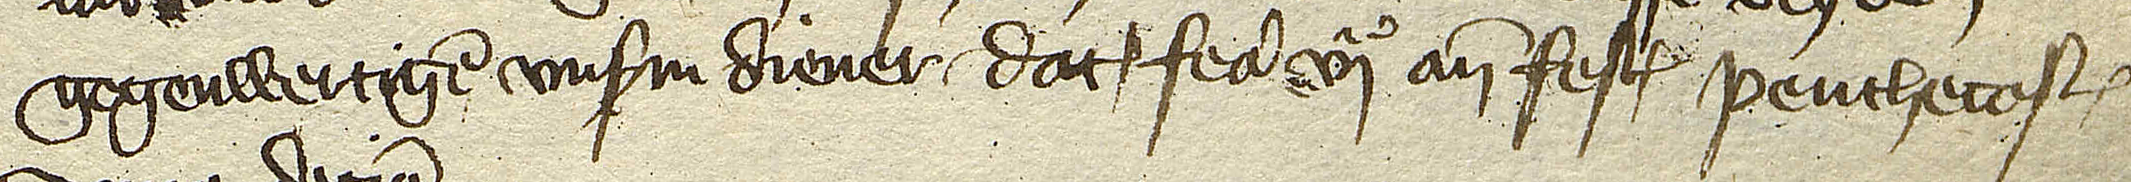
gegenwertige* vnſ*m diener / dat* fea* an* feſt* Penthecoſt*
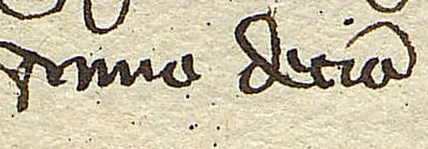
Anno decio*
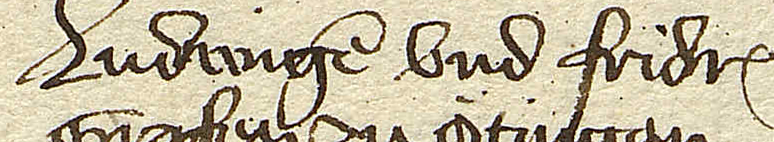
Ludwige* vnd fridr*
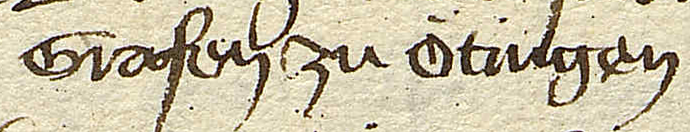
Grafen cʒu Ötingen
